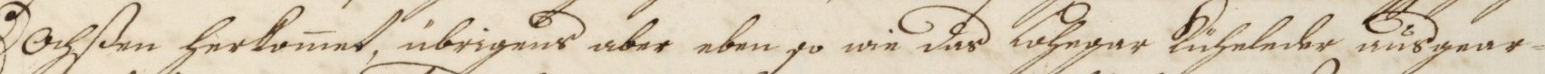Ochsen herkommet, übrigens aber eben so wie das Lohegar Küheleder ausgear-
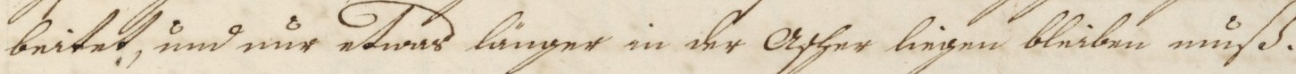beitet, und nur etwas länger in der Ascher liegen bleiben muß.
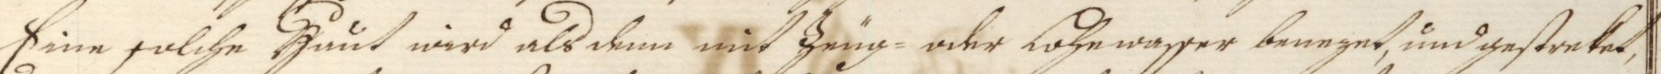Eine solche Haut wird als denn mit Zeüg- oder Lohewasser benezet, und gestreket,
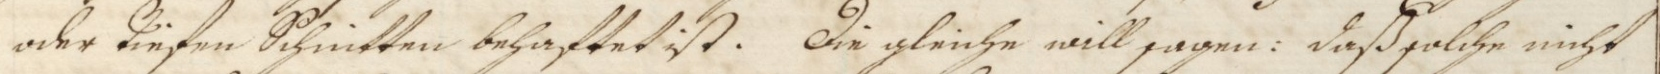oder Tiefen Schnitten behaftet ist. Die gleiche will sagen: daß solche nicht
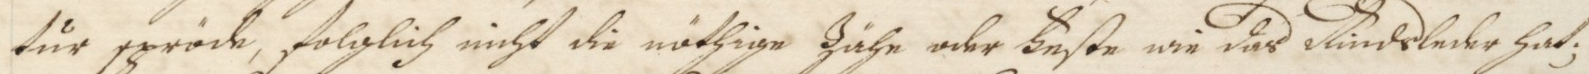tur spröde, folglich nicht die nöthige Zähe oder Feste wie das Rindsleder hat;
